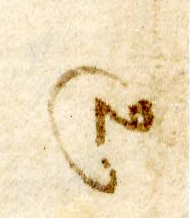2
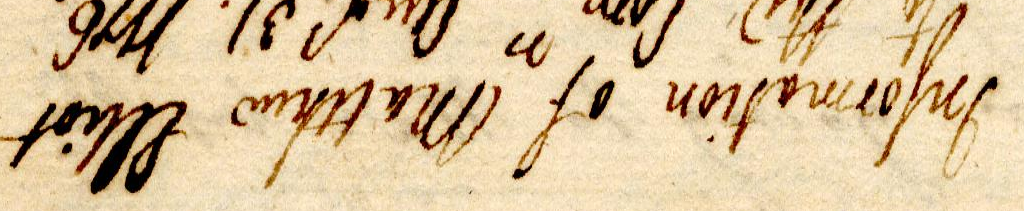Information of Matthew Elliott
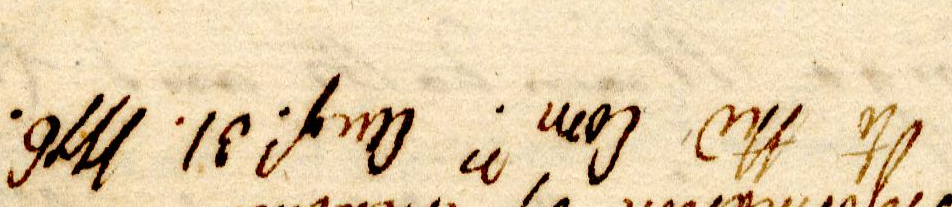to the Com^r. Aug^t. 31. 1776.
